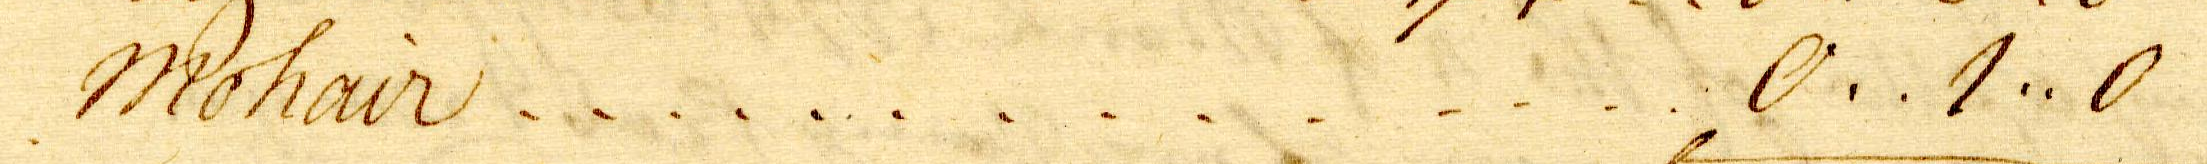Mohair.............. 0.1..0
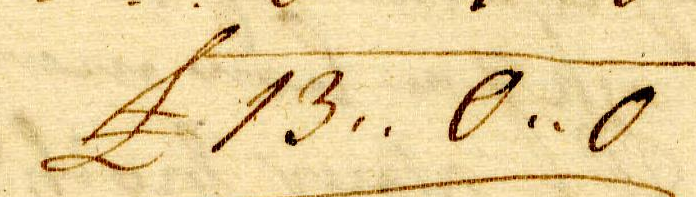£13..0..0
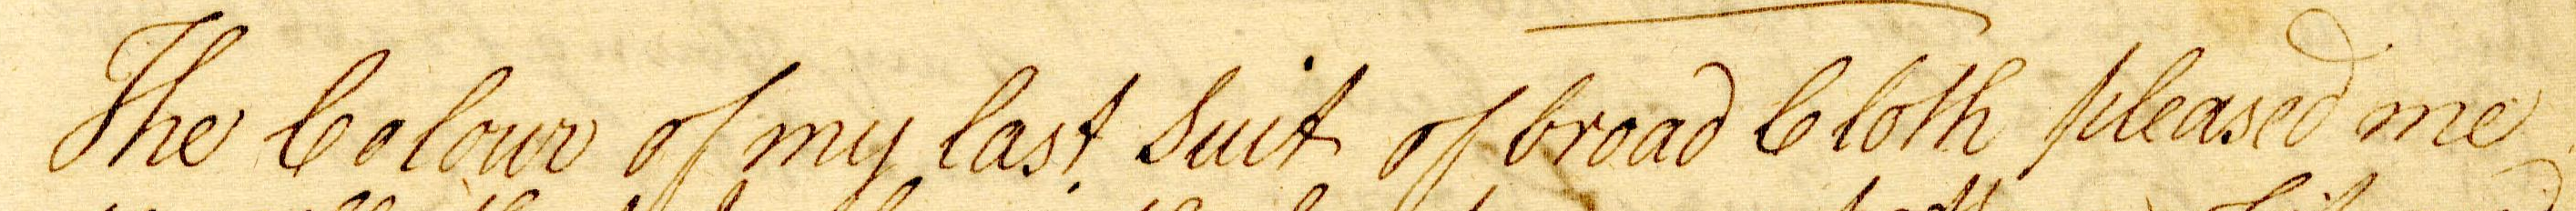The Colour of my last Suit of broad Cloth pleased me
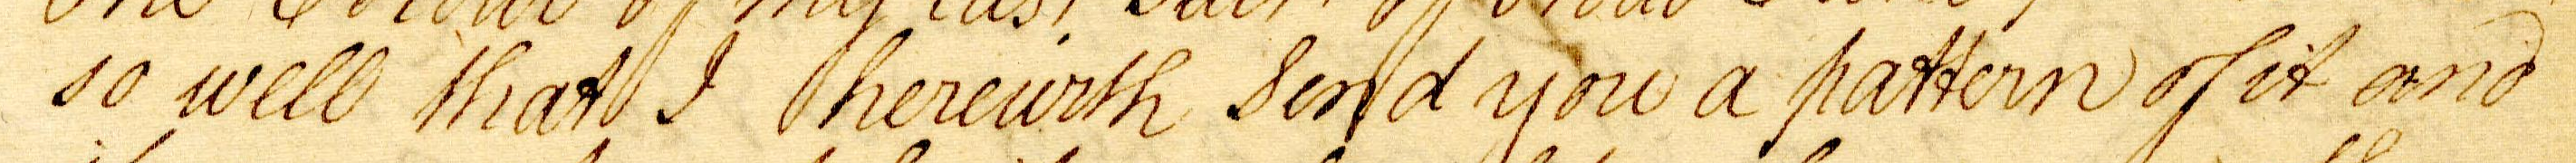so well that I therewith Send you a pattern of it and
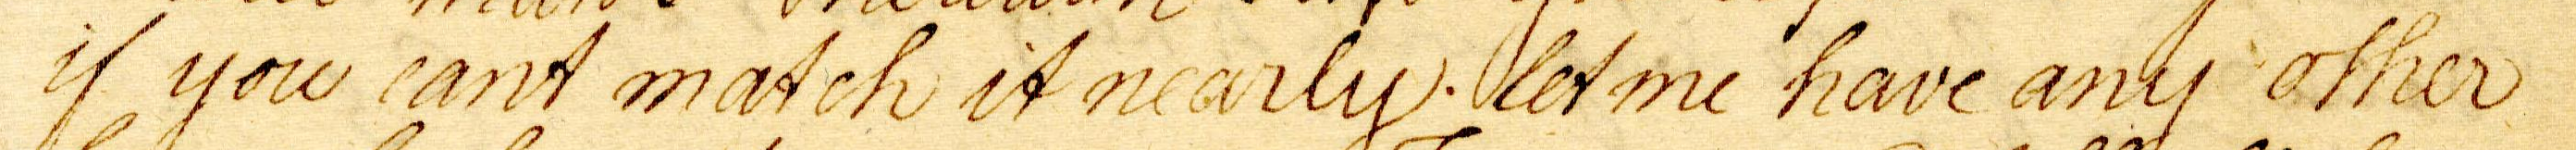if you cant match it nearly. let me have any other
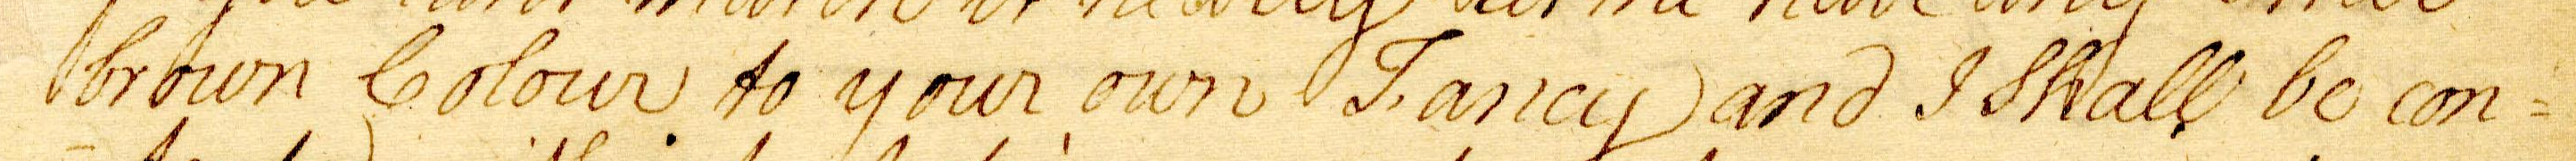brown Colour to your own Fancy and I shall be con-
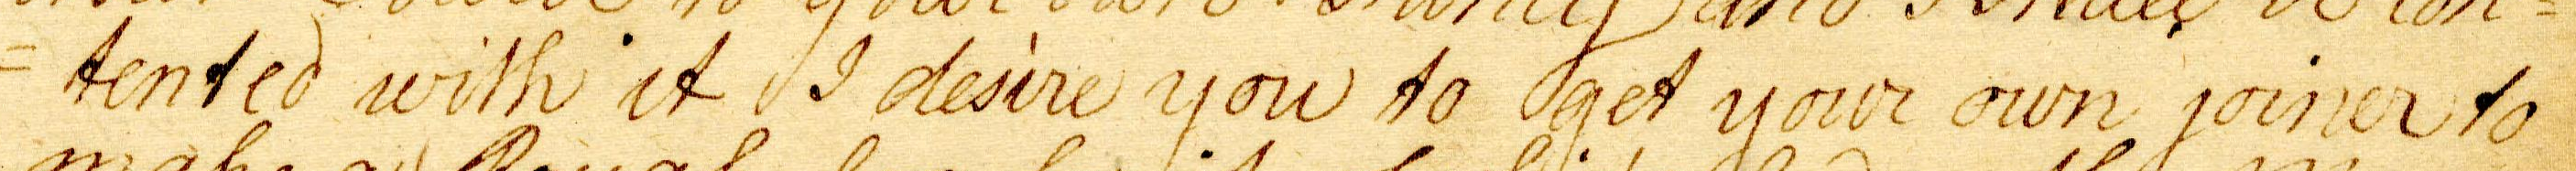-tented with it I desire you to get your own joiner to
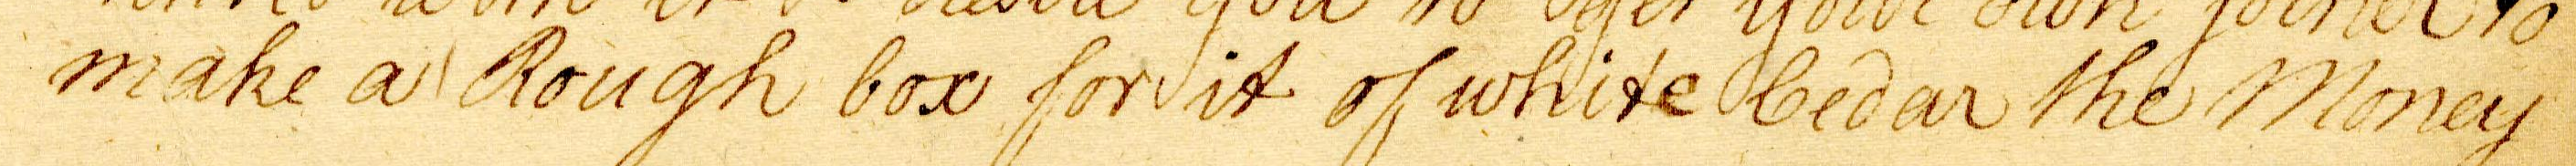make a Rough box for it of white Cedar the Money
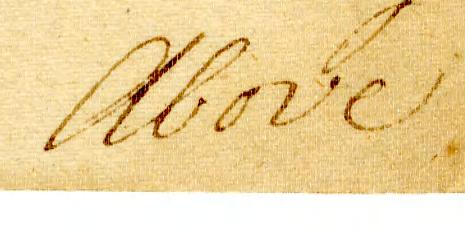Above
